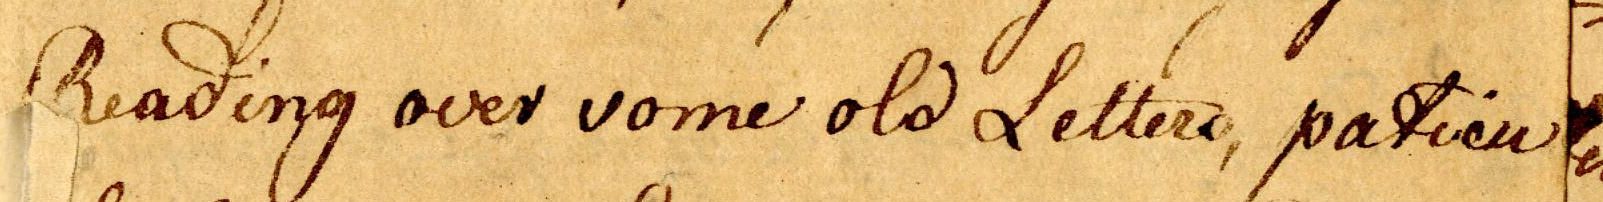Reading over some old Letters, paticu
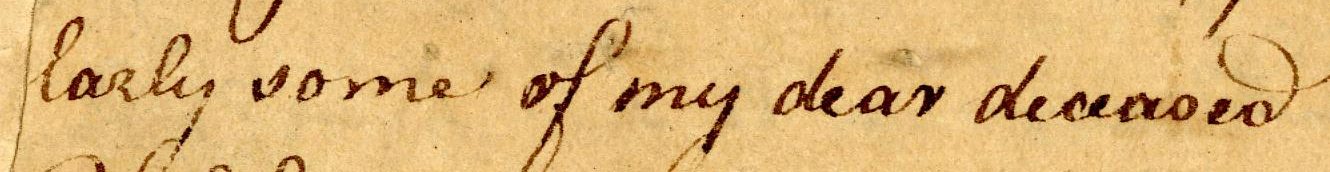larly some of my dear deceased
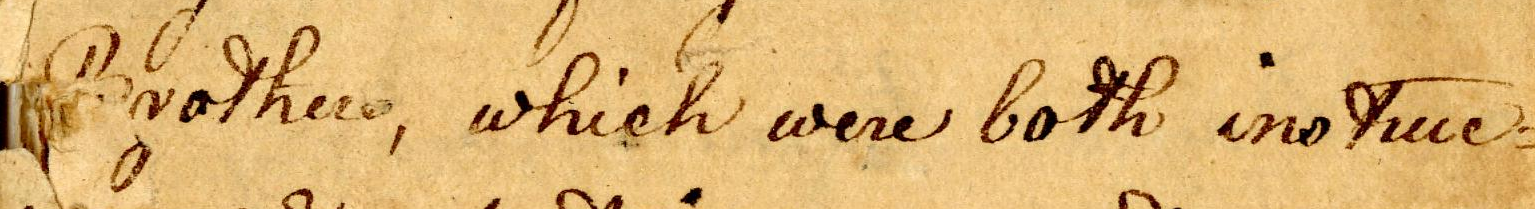Brothers, which were both instruc-
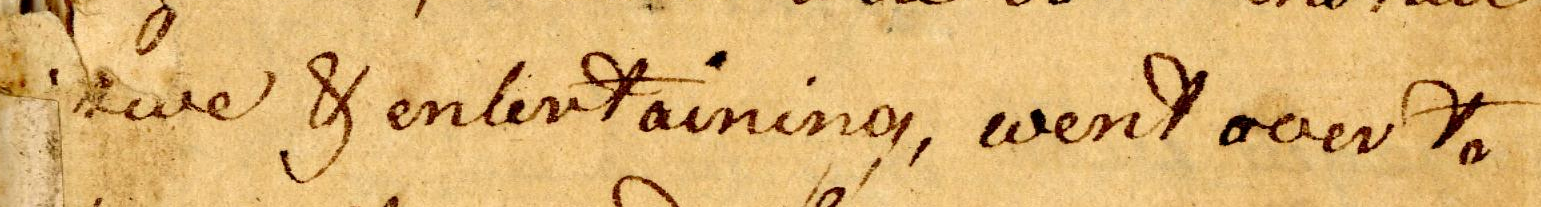tive & entertaining, went over to
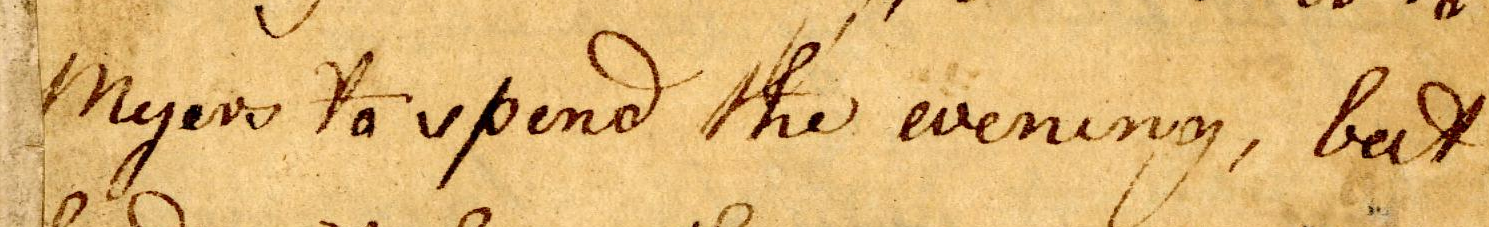Myers to spend the evening, but
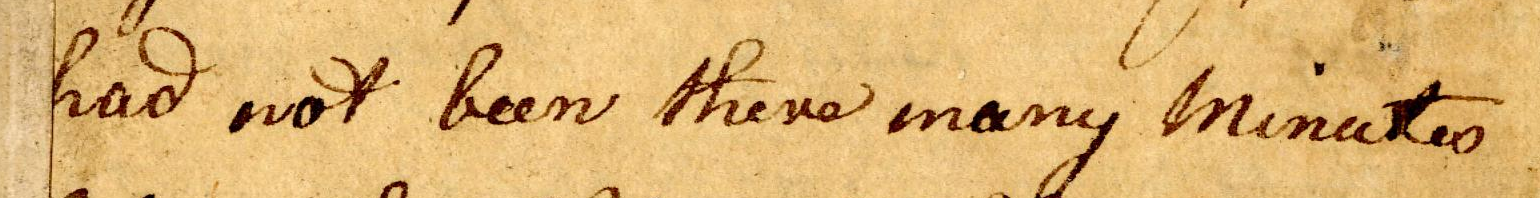had not been there many Minutes
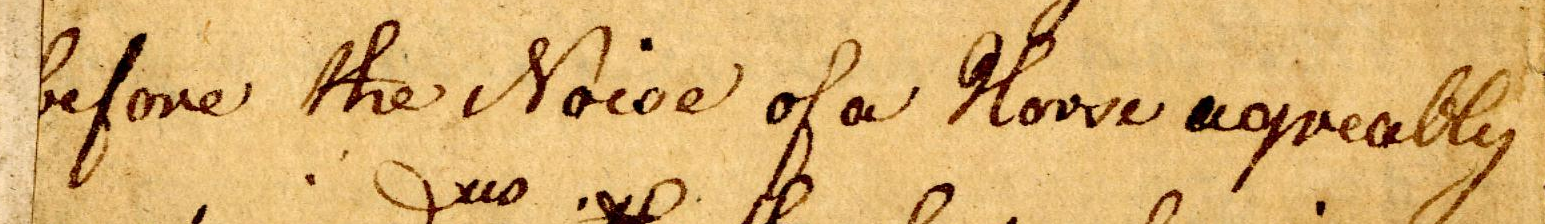before the Noise of a Horse agreably
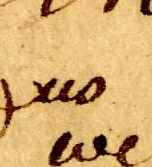us
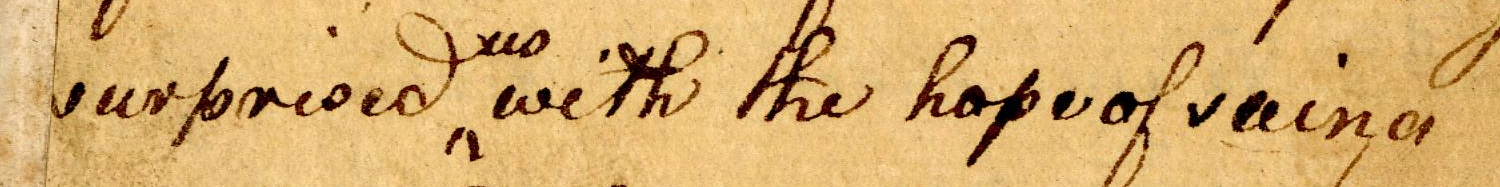surprised ^ with the hope of seeing
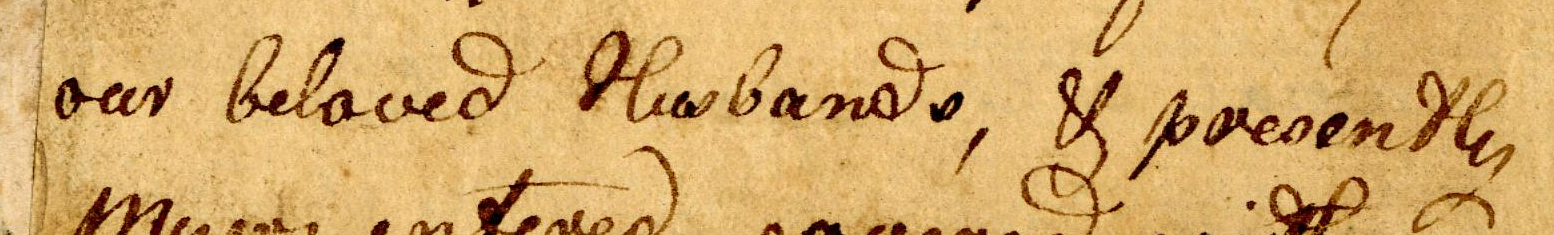our beloved Husbands, & presently
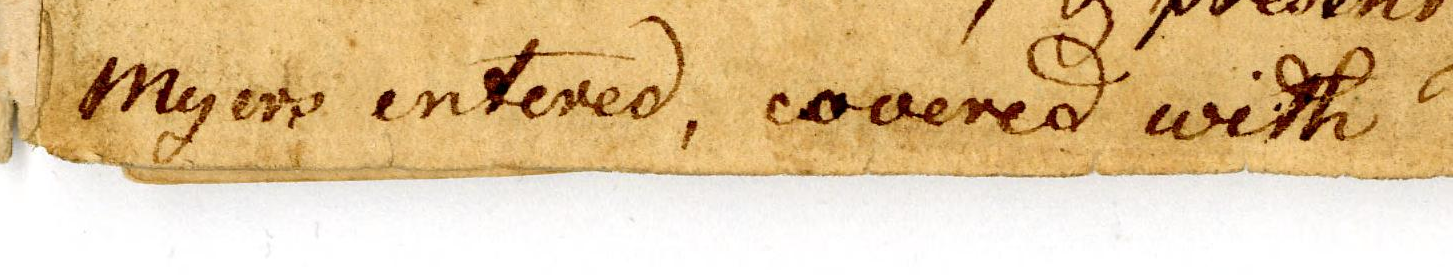Myers entered, covered with
